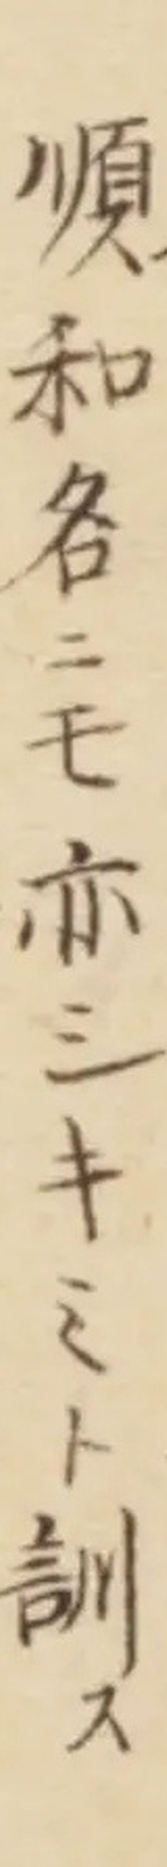順和名ニモ亦シキミト訓ス
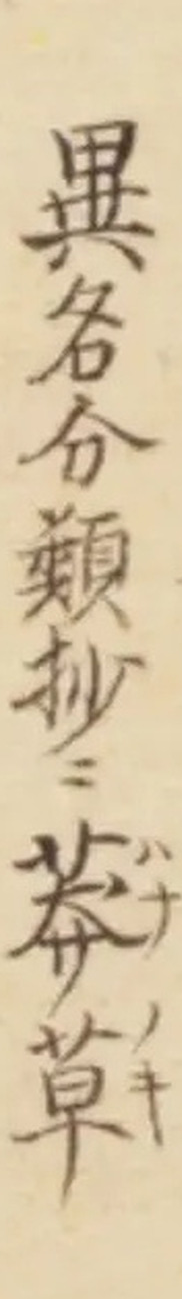異名分類抄莽草
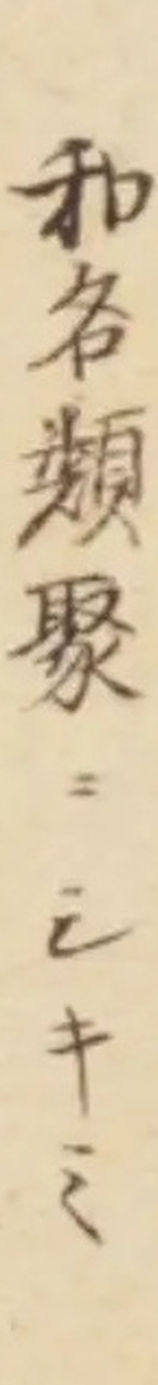和名類聚シキミ
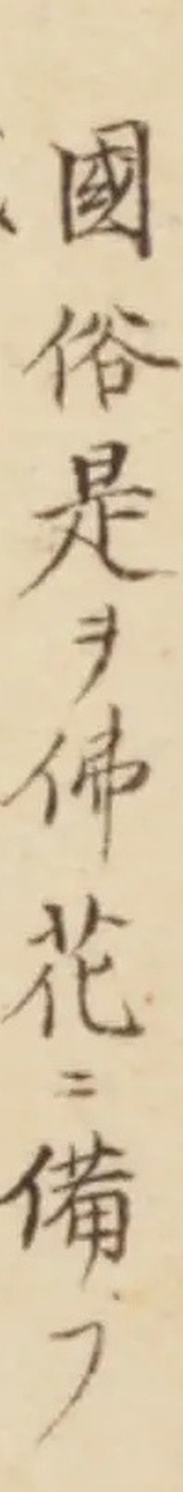国俗是ヲ仏花ニ備フ
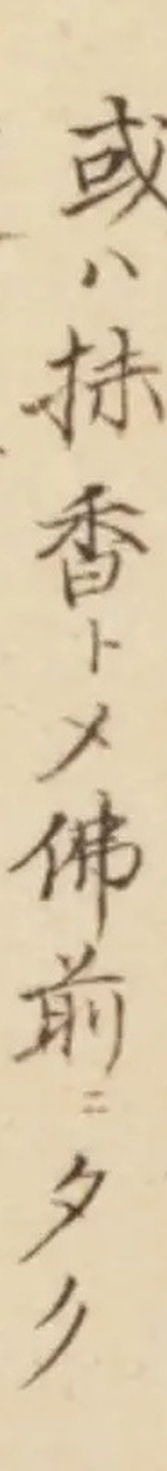或ハ抹香トシテ仏前ニタク
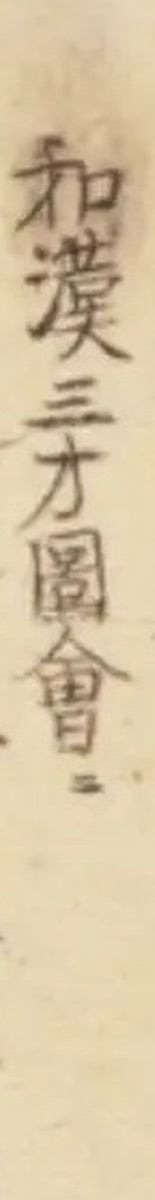和漢三才図会
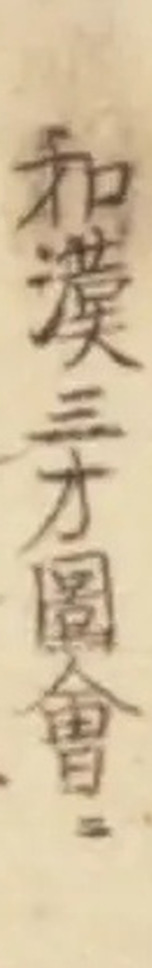和漢三才図会
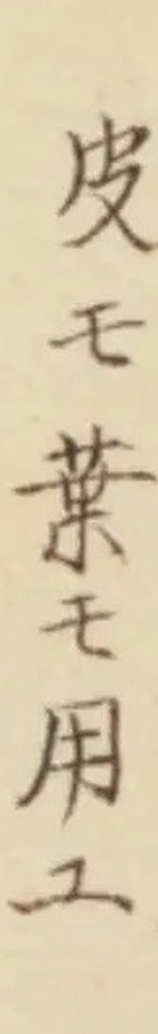皮モ葉モ用ユ
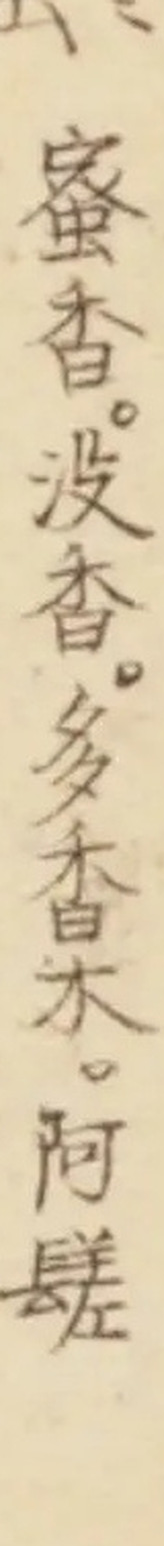木蜜蜜香。没香。多香木。阿
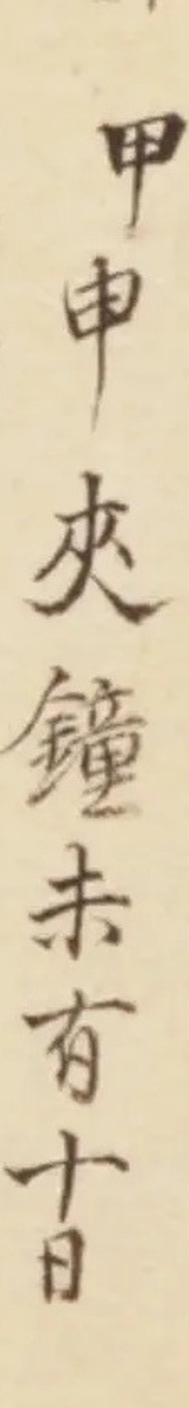甲申夾鐘未有十日
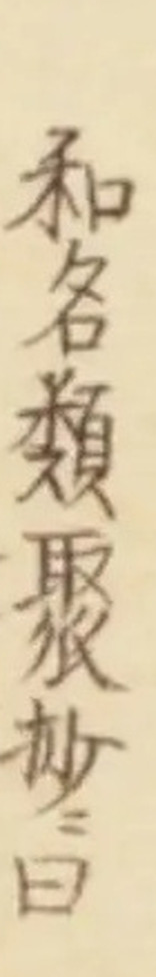和名類聚抄曰
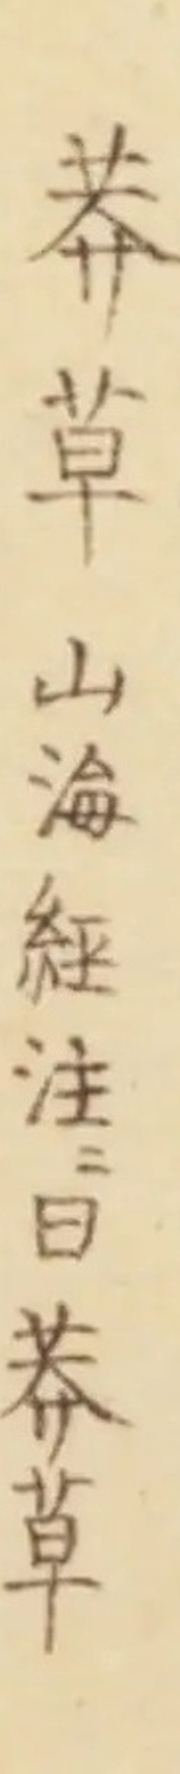莽草山海経注曰莽草
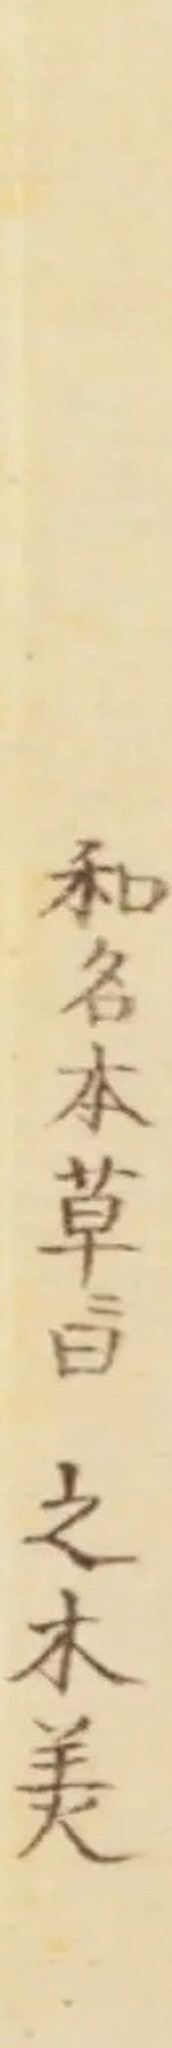和名本草曰之木美
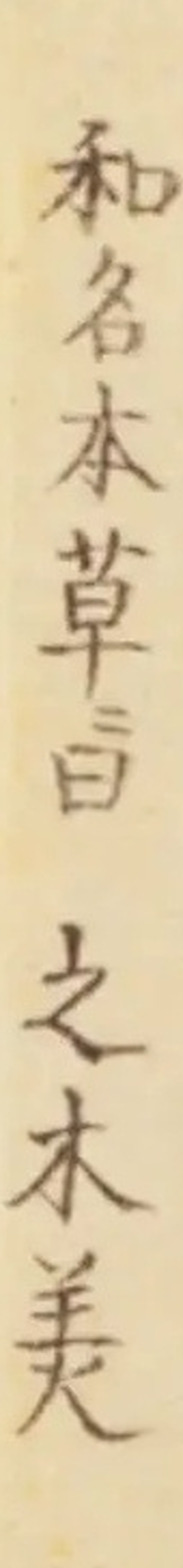和名本草曰之木美
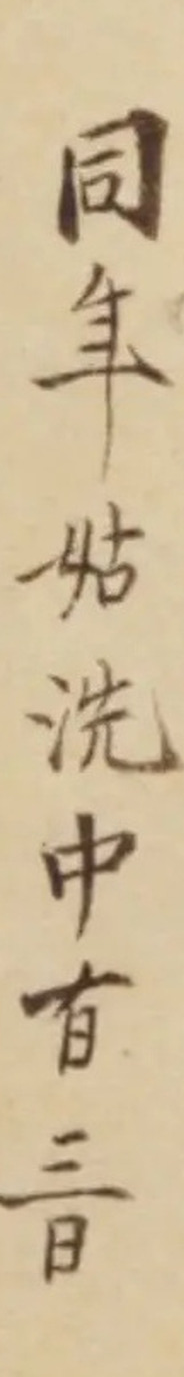同年姑洗中有三日
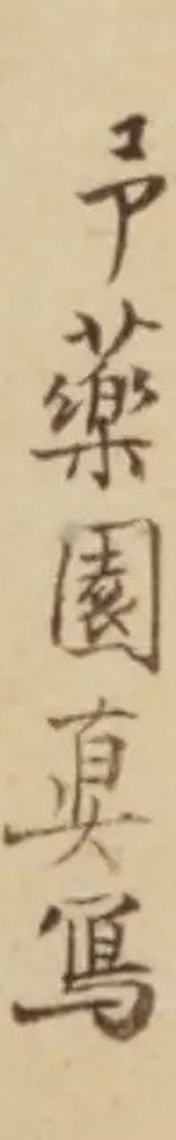予薬園真写
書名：梅園草木花譜春之部. 1
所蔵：国立国会図書館 National Diet Library, JAPAN
